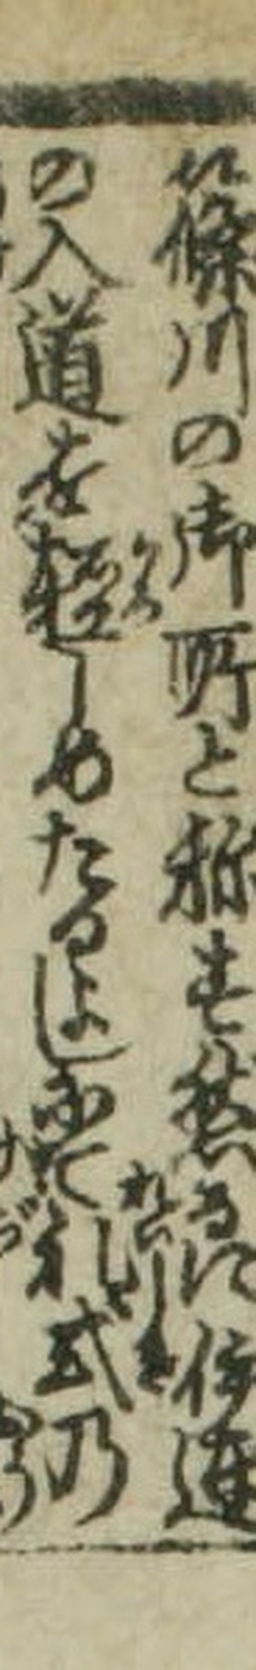の入道を軽しめたるよしにて礼式の
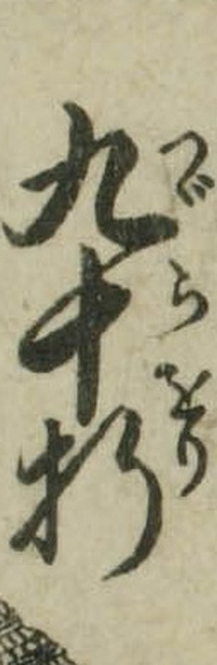九十折
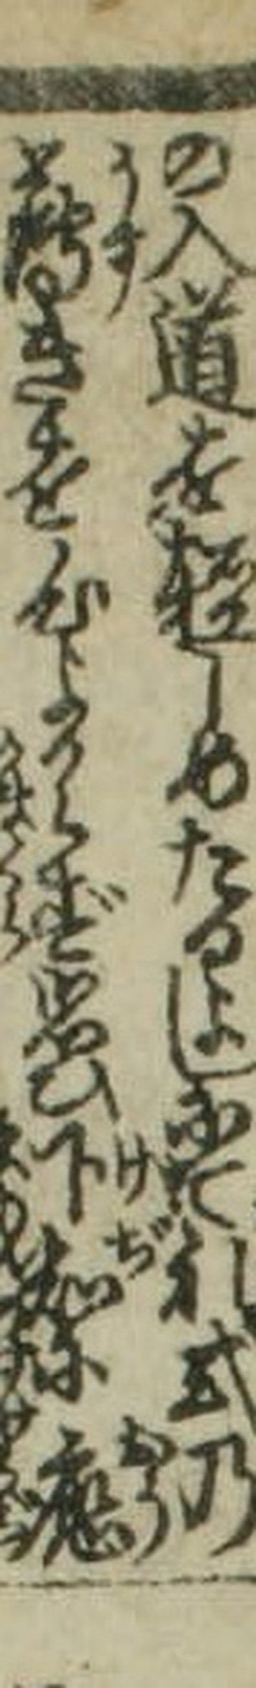薄きを心よからず思ひ下知に応
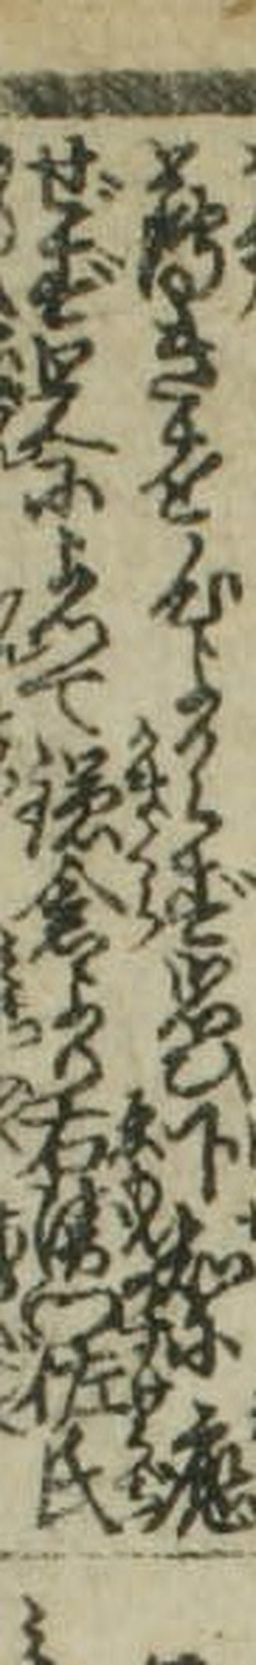ぜず是によつて鎌倉より右衛門佐氏
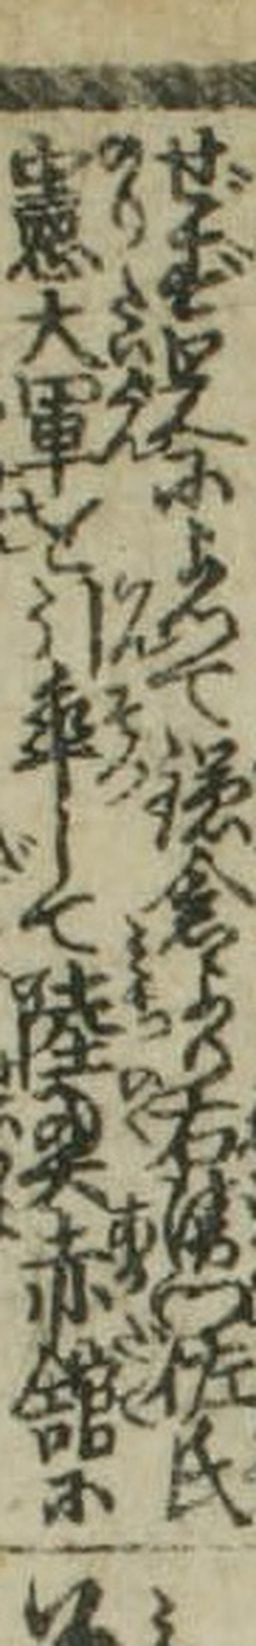憲大軍を引率して陸奥赤館に
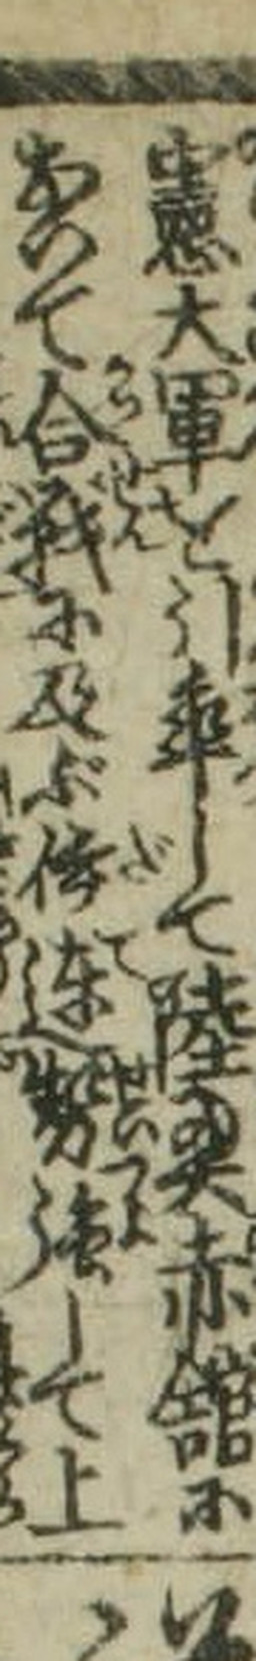おいて合戦に及ぶ伊達勢強して上
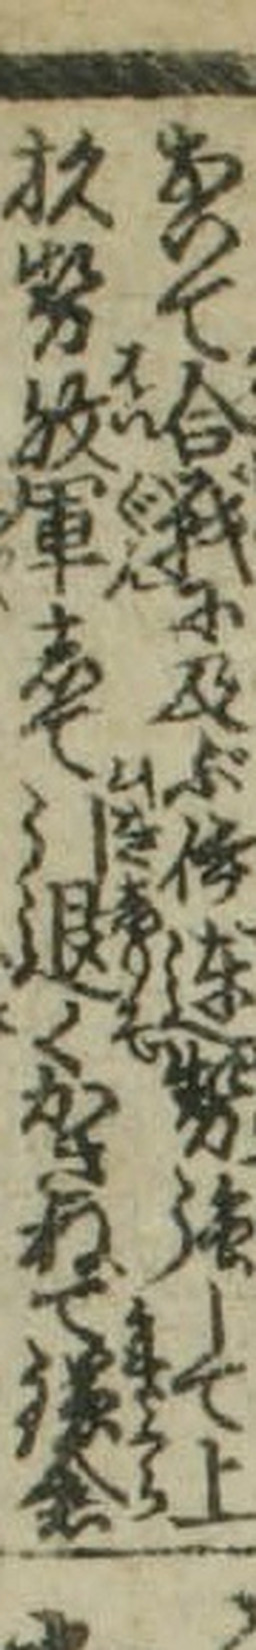杉勢敗軍して引退くかさねて鎌倉
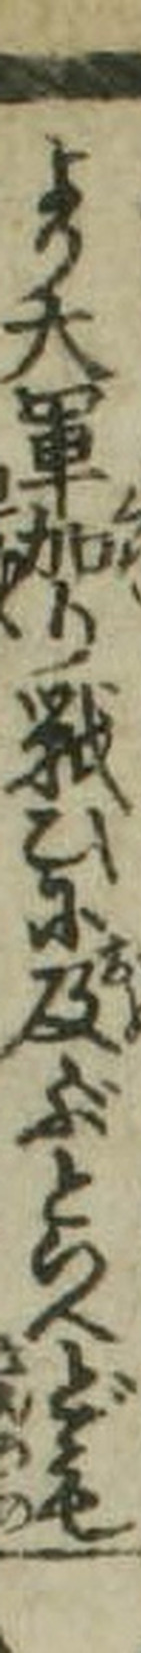より大軍加り戦ひに及ぶといへども
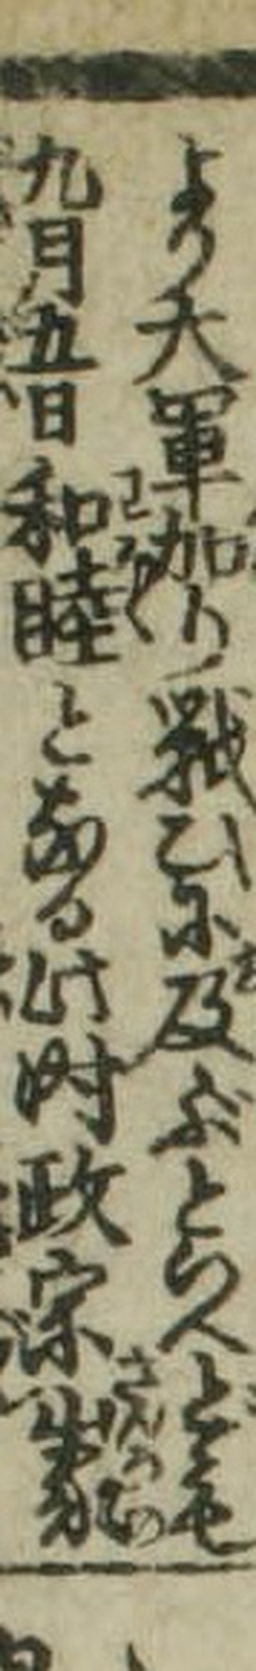九月五日和睦となる此時政宗山家
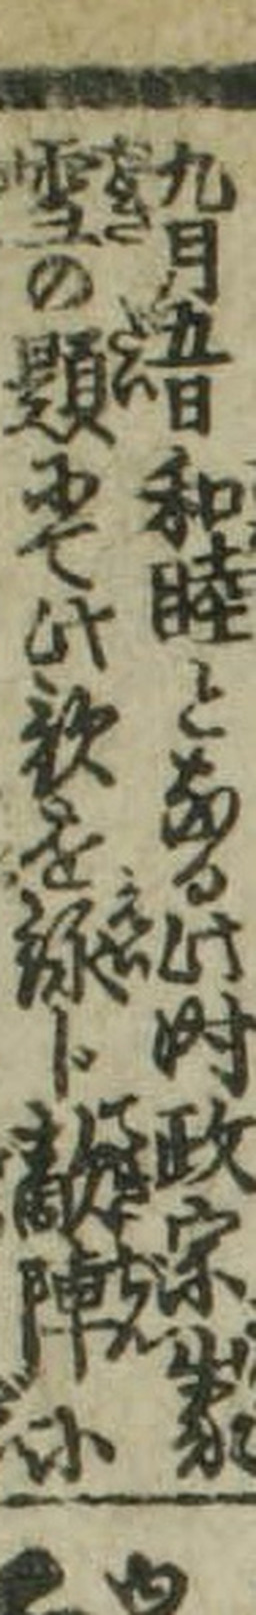雪の題にて此歌を詠じ敵陣に
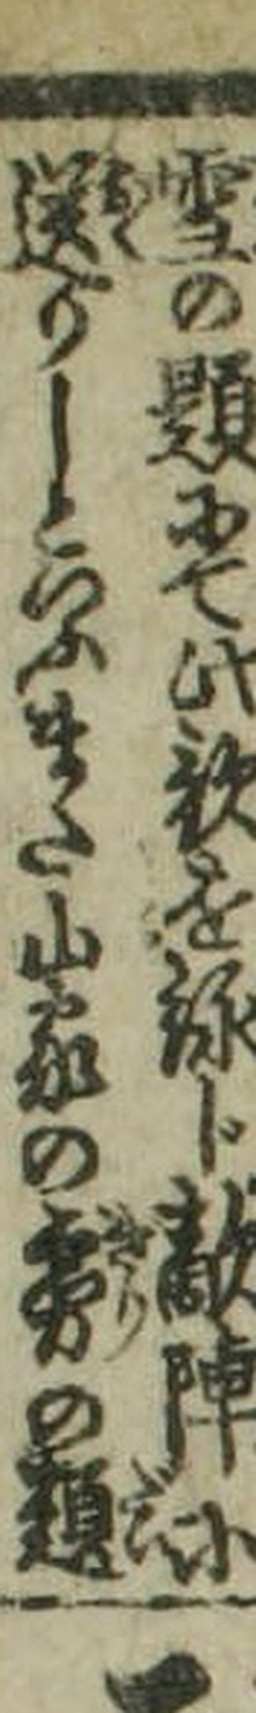送りしといふまた山家の霧の題
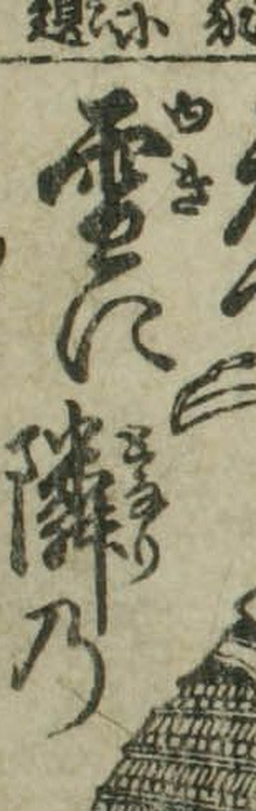雪に隣の
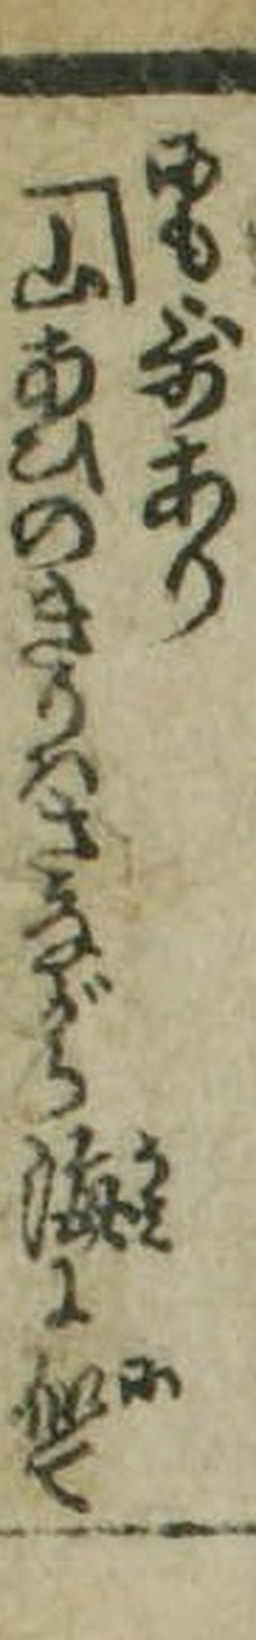〽やまあひのきりはさながら海に似て
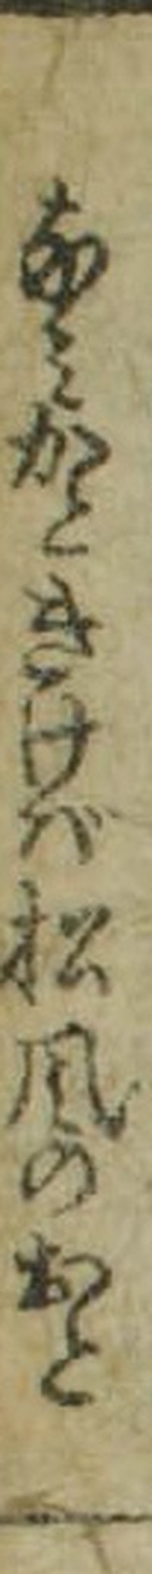なみかときけば松風のおと
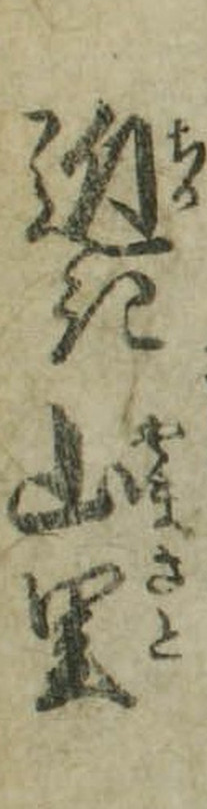近き山里

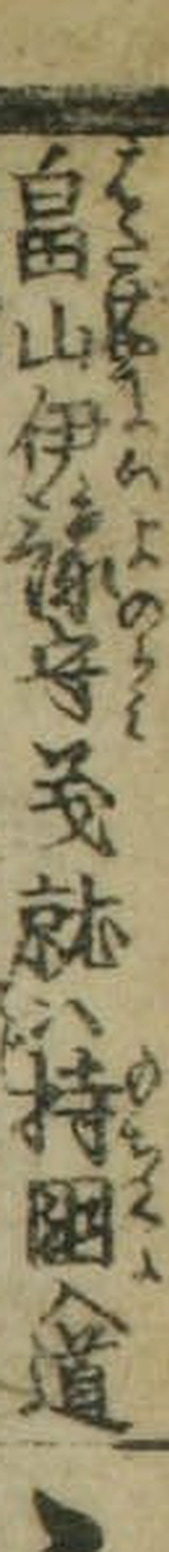畠山伊豫守義就は持国入道
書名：續英雄百人一首
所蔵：東京学芸大学附属図書館
